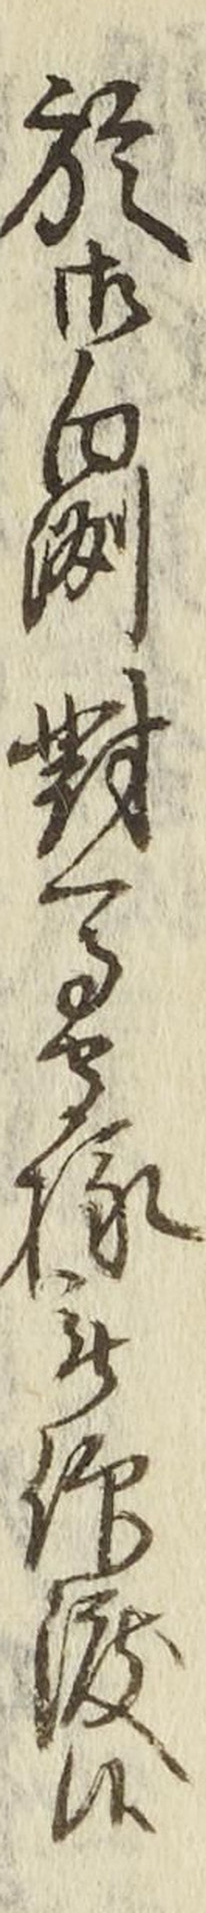於御白洲対馬守様被仰渡候
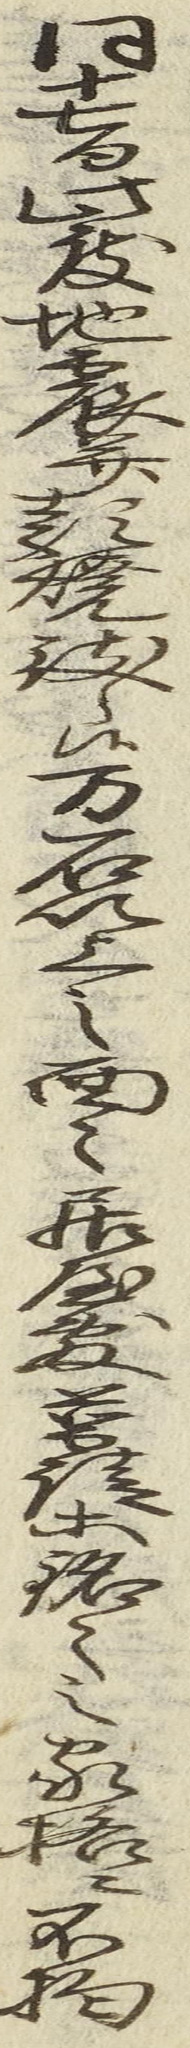一同十七日此度地震幷類焼致し候万石以上之面々居屋敷普請等銘々之家格ニ不拘
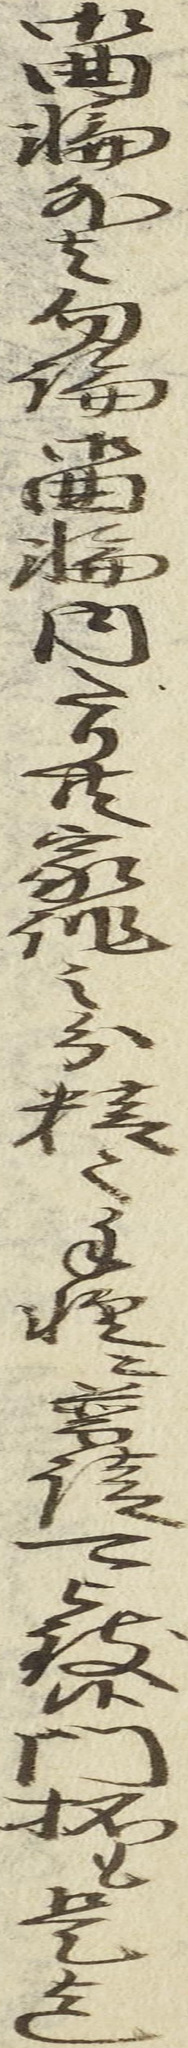御曲輪外者勿論御曲輪内たり共家作之分精々手軽ニ普請可被致候門抔も是迄
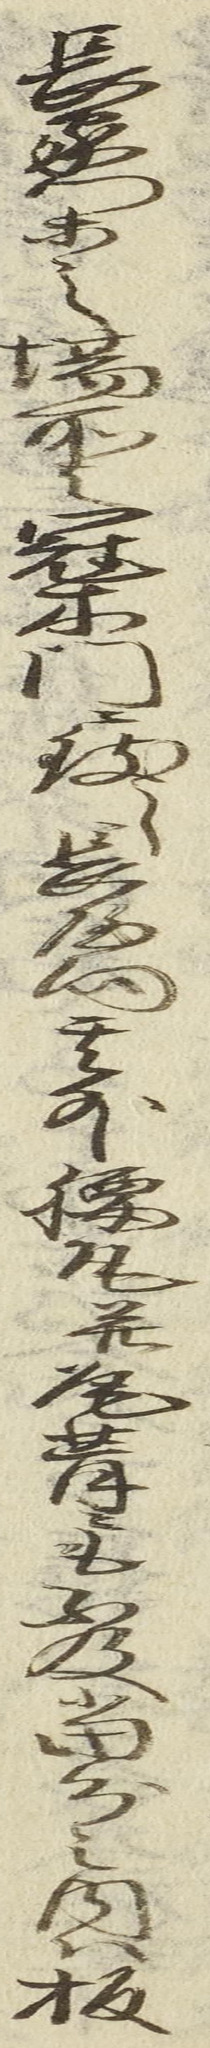長家門等之場所者冠木門ニ致し長屋向其外腰瓦幷瓦葺ニも不及当分之内は板
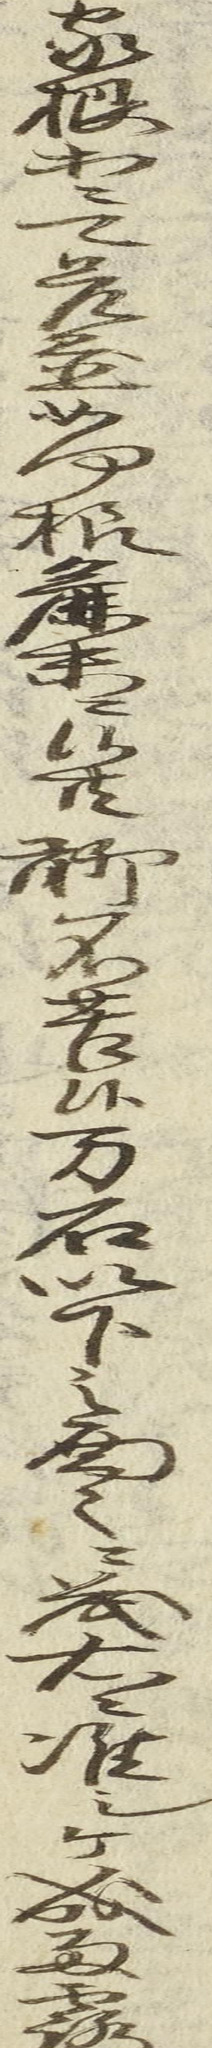屋根等ニ可差置如何様麁末ニ候共聊不苦候万石以下之面々ニも右ニ准シケ成雨露
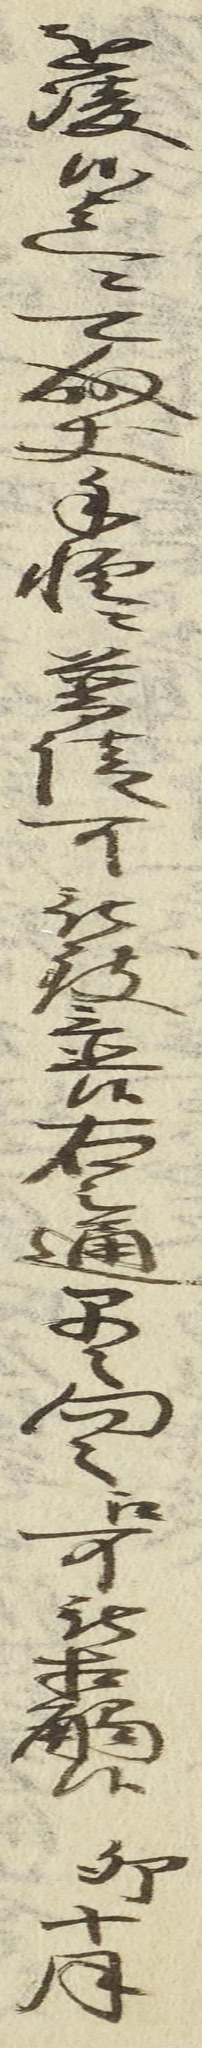を凌候迄ニ可成丈手軽ニ普請可被致置候右之通早々向々江可被相触候卯十月
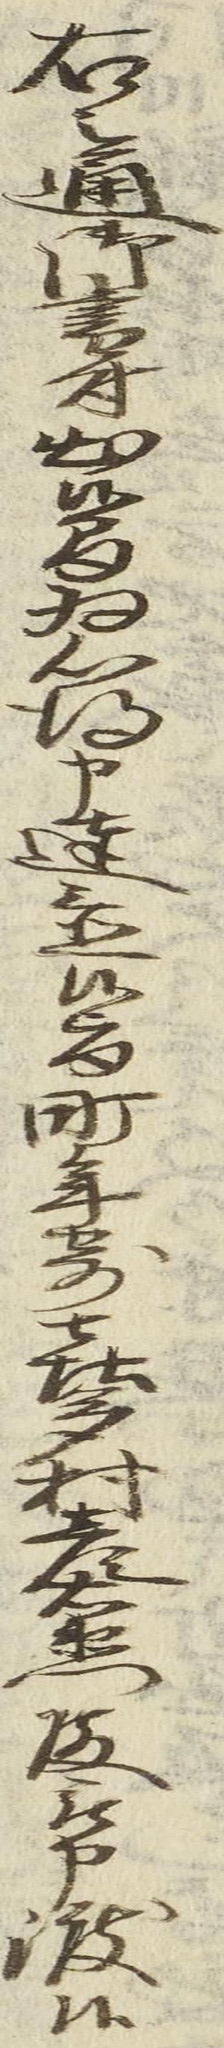右之通御書付出候間為心得申達置候旨町年寄喜多村彦右衛門殿被申渡候
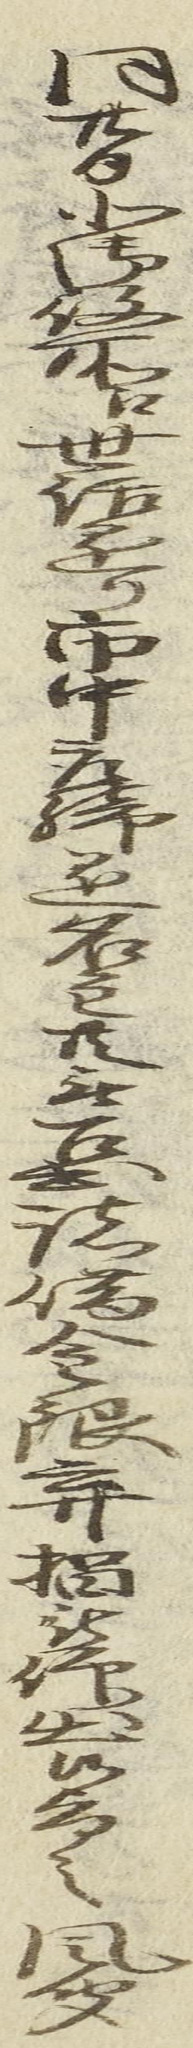一同廿日北御役所江世話懸り市中取締名主共被召出諸借金銀弁捐被仰出候旨之風聞
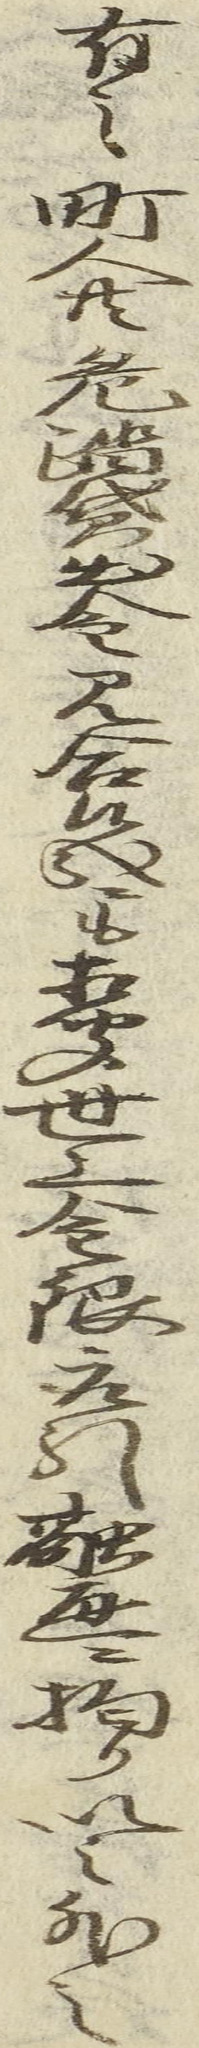有之町人共危踏貸出令見合候哉ニも相聞世上金銀取引融通ニ拘り以之外之
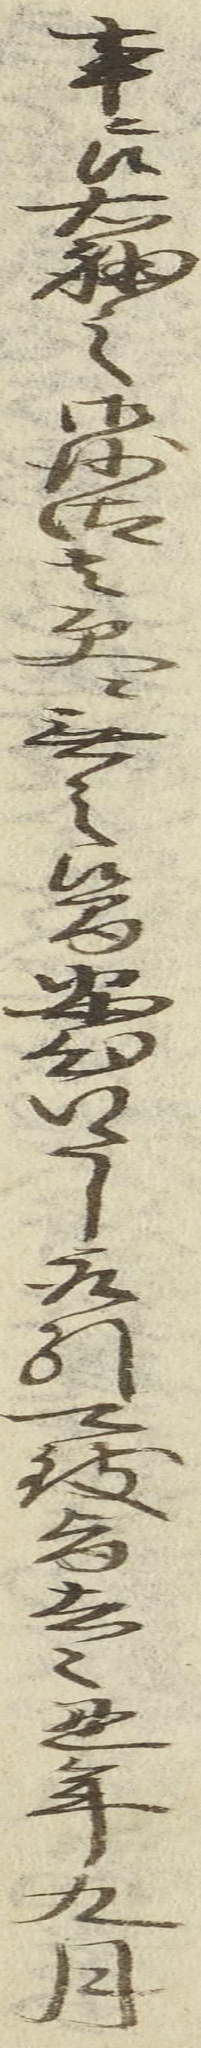事ニ候右躰之御沙汰者更ニ無之候間安心いたし取引可致旨去々丑年九月
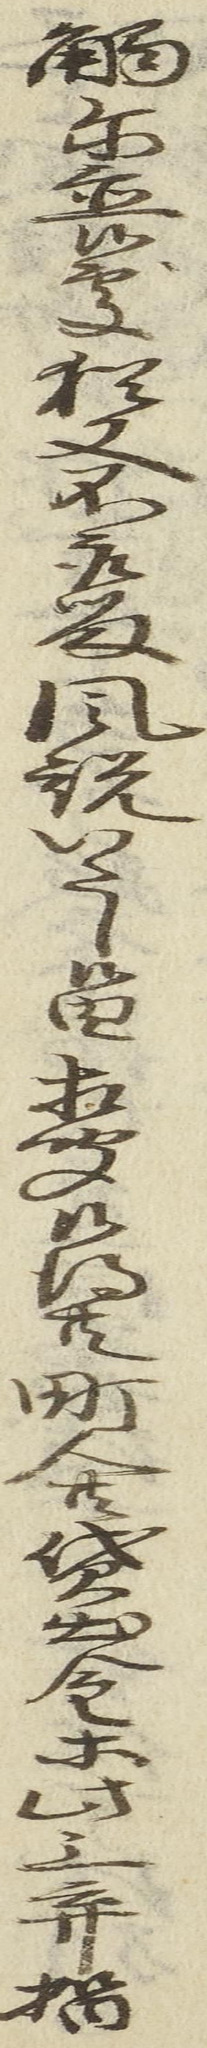触示置候処猶又猶不取留風説いたし候由相聞候得共町人共貸出金等此上棄捐

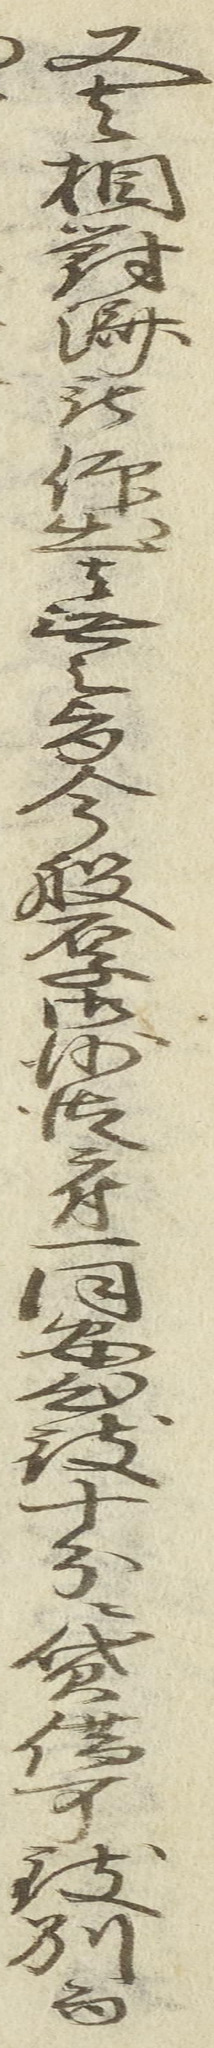又者相対済被仰出者無之旨今般厚御沙汰ニ付一同安心致十分ニ貸借可致別而
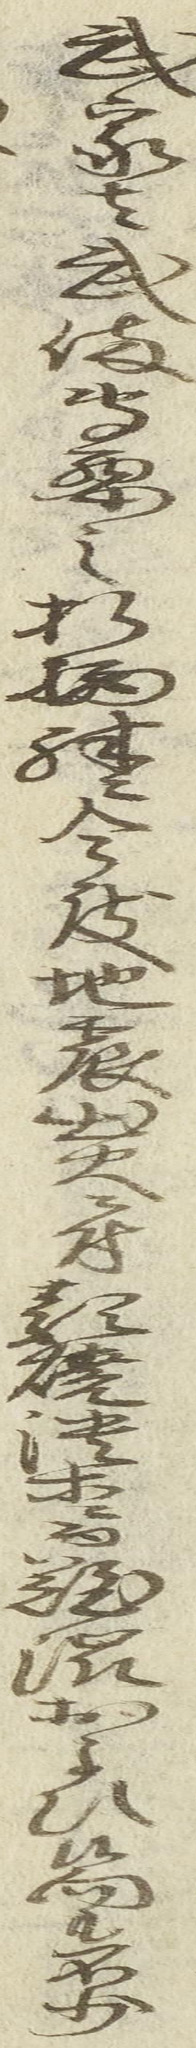武家者武備専要之折柄殊ニ今度地震出火ニ付類焼潰等ニ而難渋およひ候向も不少
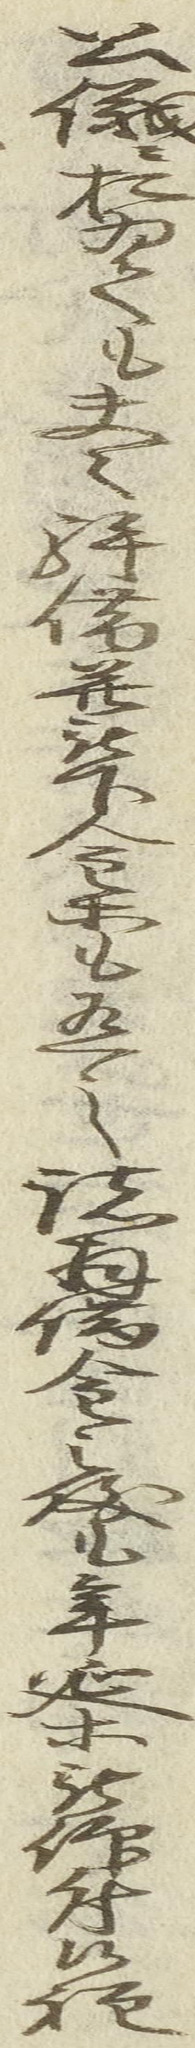公儀ニ於ゐても夫々拝借幷下金等も有之諸拝借金之儀も年延等被仰付候程
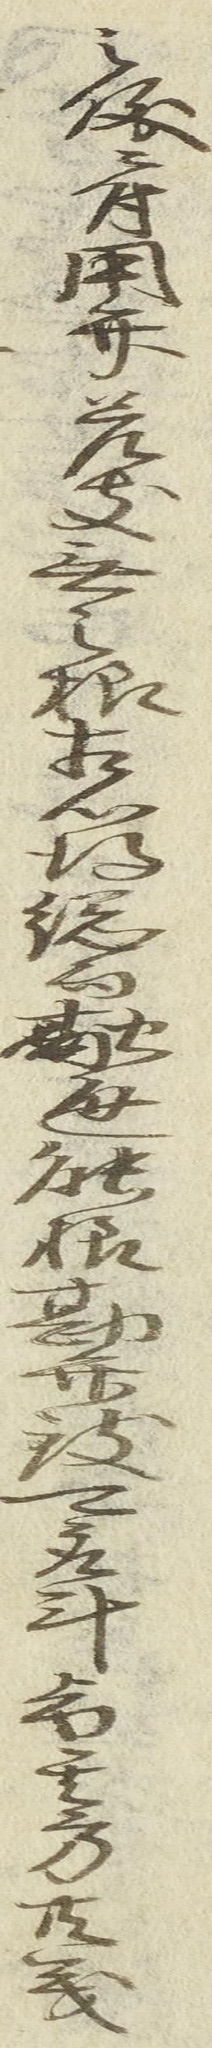之儀ニ付用弁差支無之様相心得総而融通能様勘弁致可取計旨其方共義
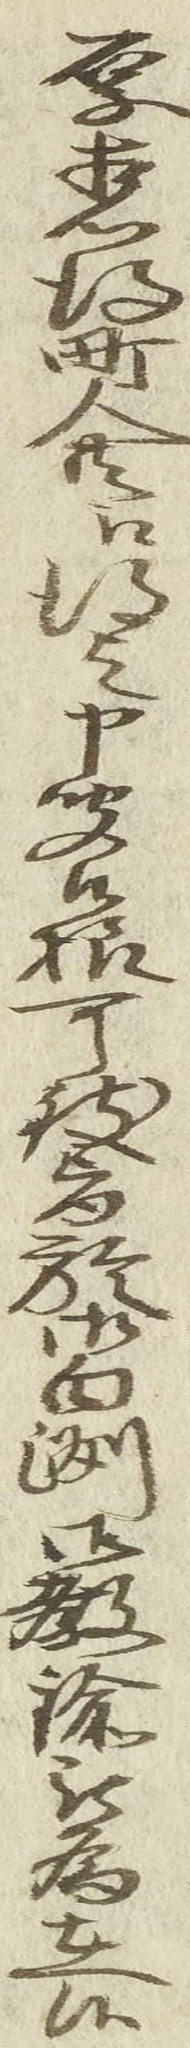厚相心得町人共江得与申聞候様可致旨於御白洲御教諭被為在候
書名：安政二年震災記事　完
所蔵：東京大学地震研究所図書室 Earthquake Research Institute Library, The University of Tokyo, JAPAN
